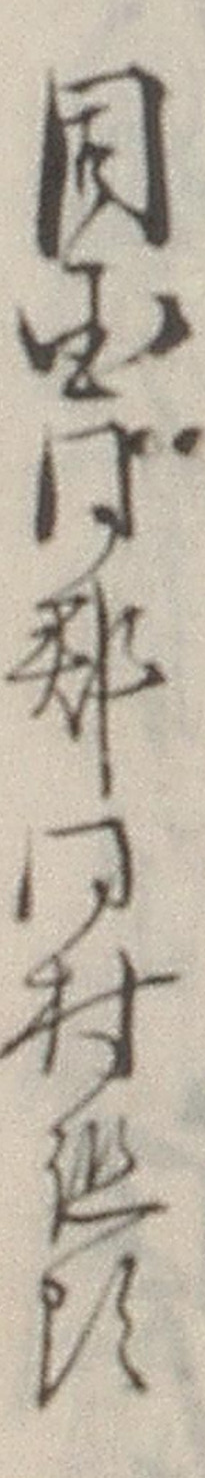同国同郡同村組頭
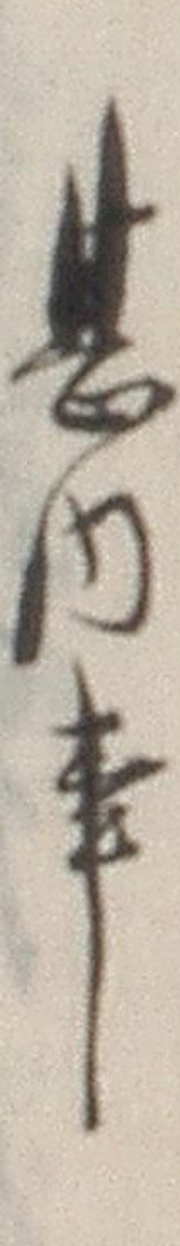甚内事
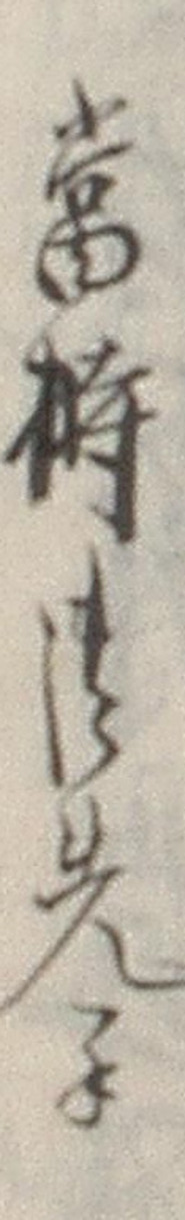当時御先手
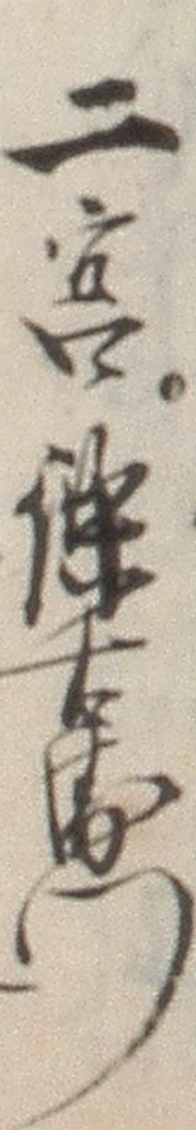二宮継右衛門
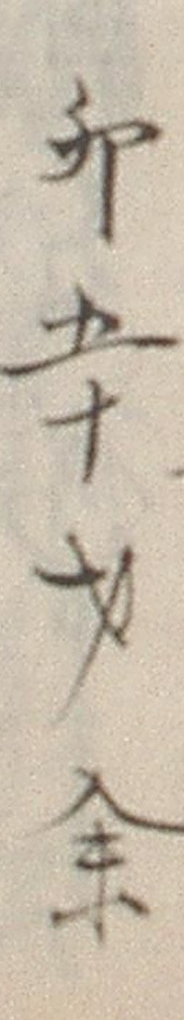卯五十才余
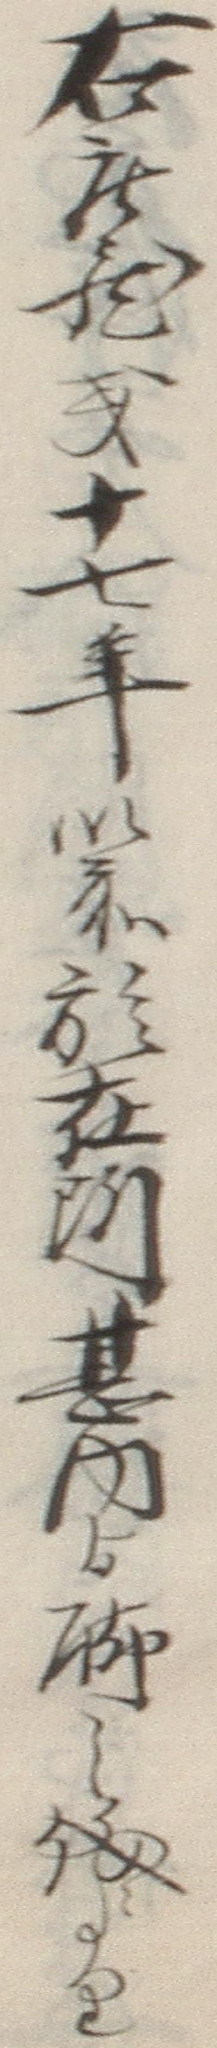右庄蔵義十七以前於在所甚内と聊之儀より
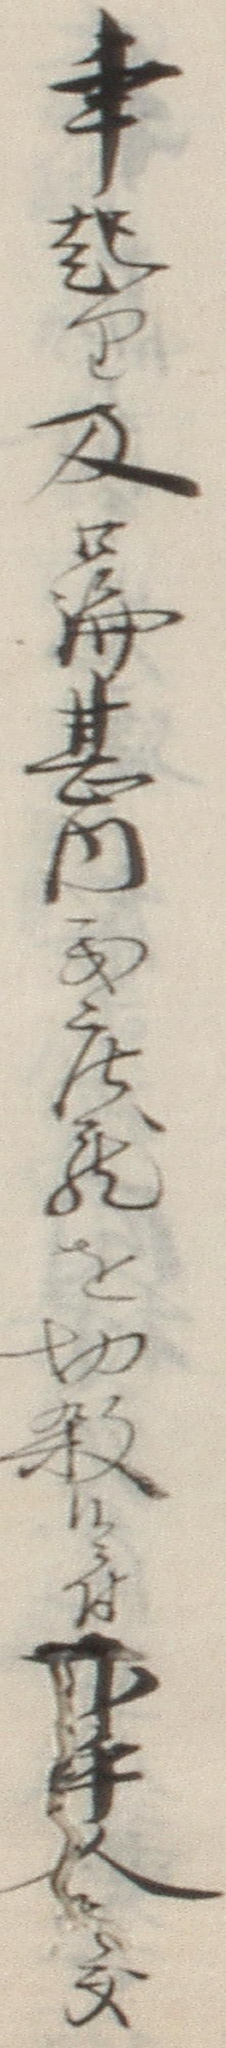事起り及口論甚内義庄蔵を切殺候ニ付下手人之義
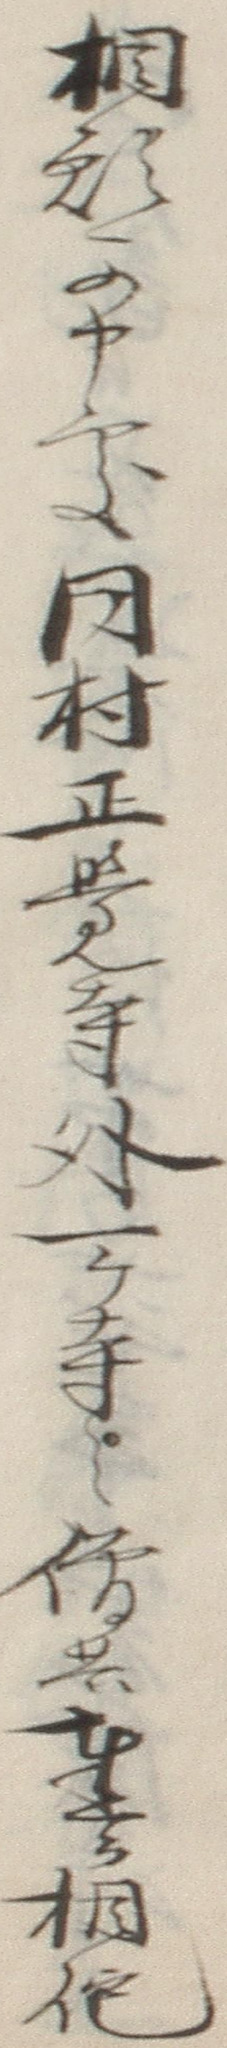相願可申処同村正覚寺外一ケ寺之僧共奉上而相詫
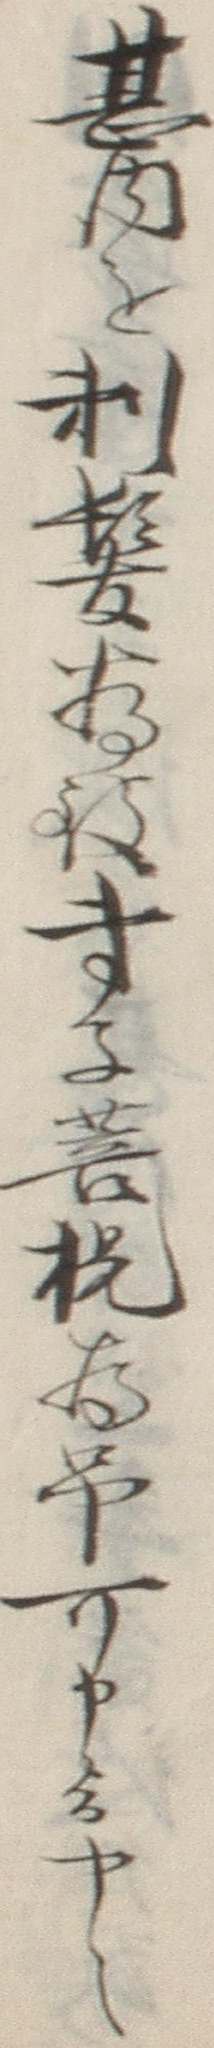甚内を剃髪為致弟子菩提為吊可申旨申
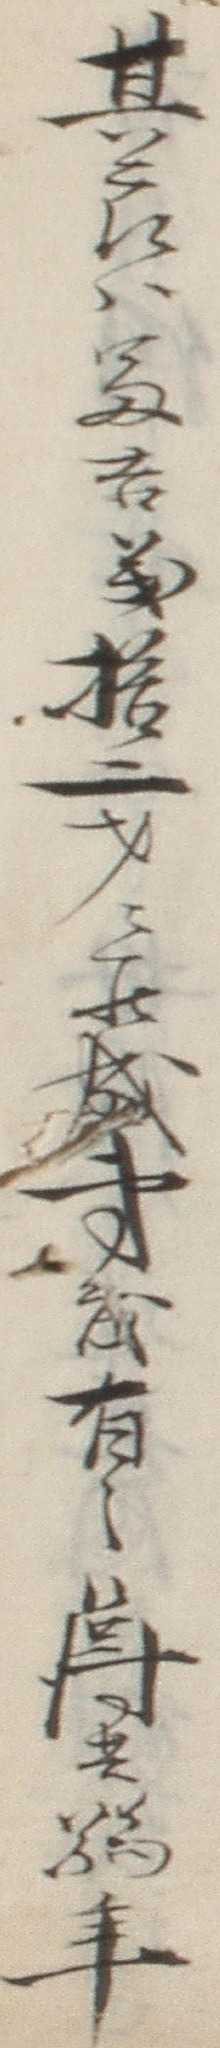其節ハ富吉義拾二才ニ罷成弟も有之候得共弱年

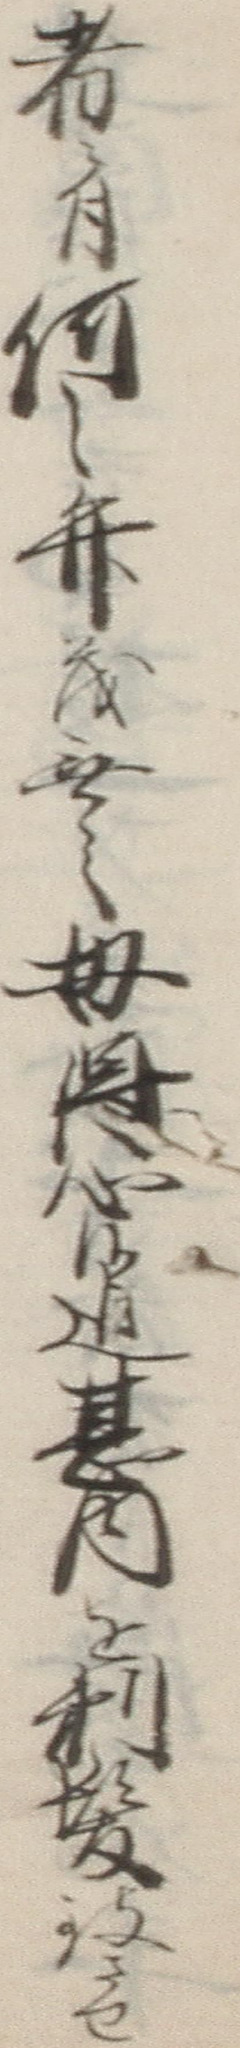者ニ付何之弁も無之母得心候迄甚内を剃髪致さセ
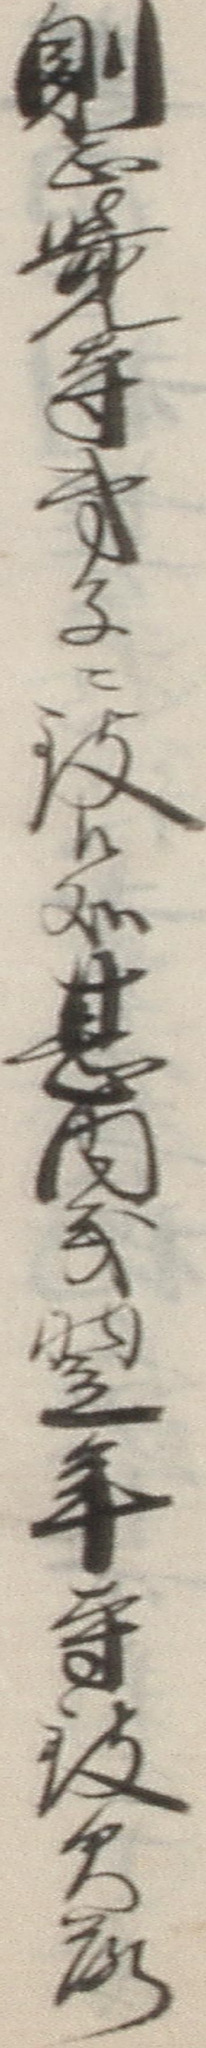則正覚寺弟子ニ致候処甚内義翌年致欠落
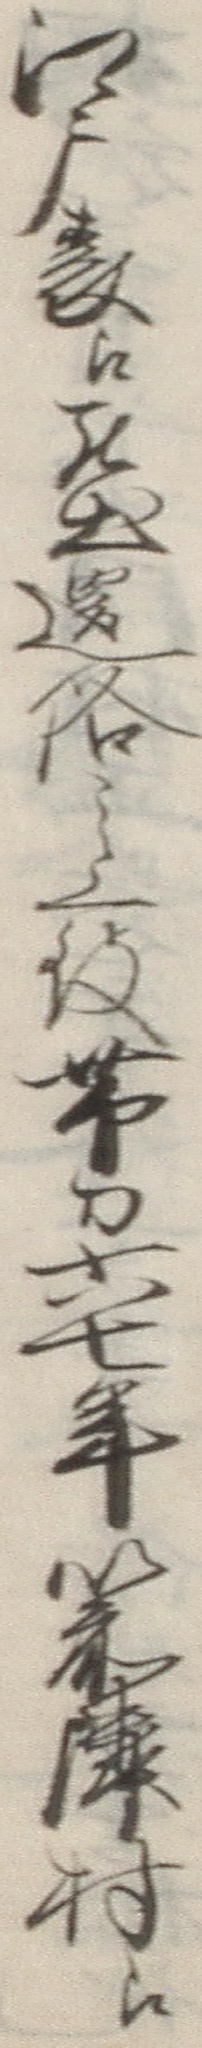江戸表え罷出還俗之上致帯刀六七年以前隣村え
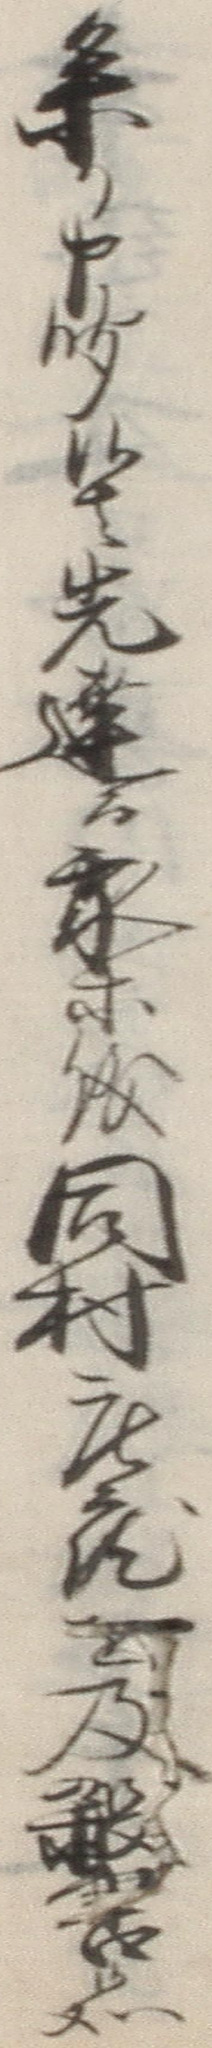参り申聞候は先達而来等儀同村庄蔵を及殺害候処
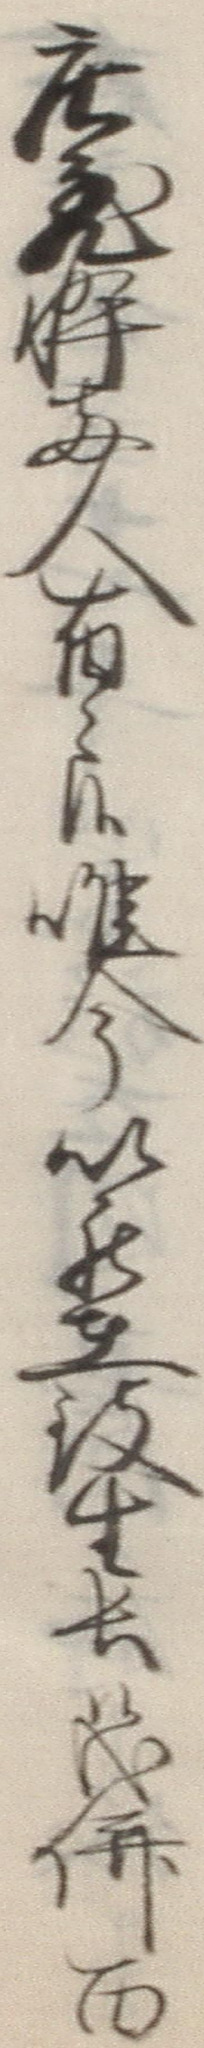庄蔵倅両人有之候唯今以罷在致生長候哉併百
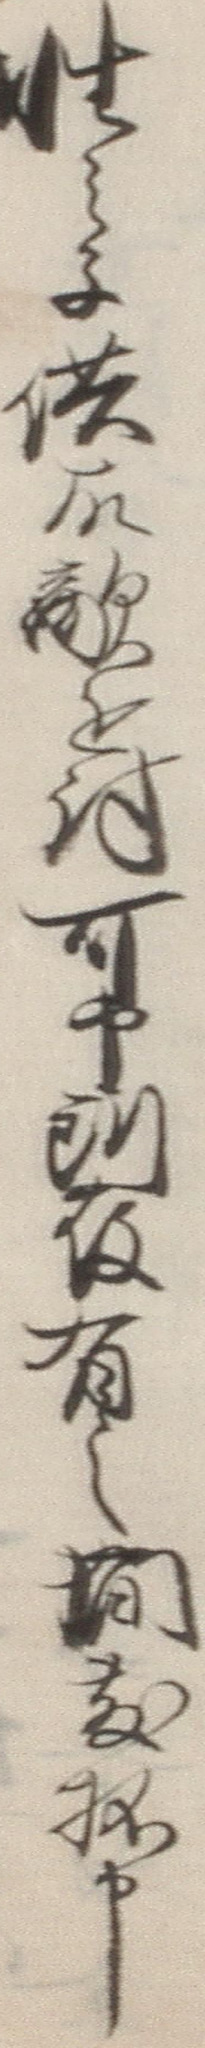性之子供衆敵を討可申所存有之間敷抔申
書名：[諸国災害記録]
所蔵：東京大学地震研究所図書室 Earthquake Research Institute Library, The University of Tokyo, JAPAN
